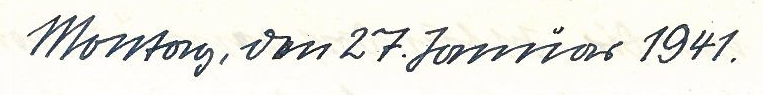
Montag, den 27. Januar 1941.
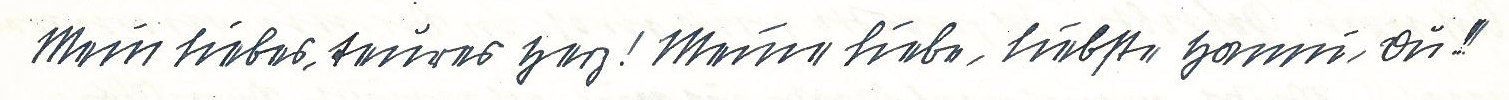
Mein liebes, teures Herz! Meine liebe, liebste Du!
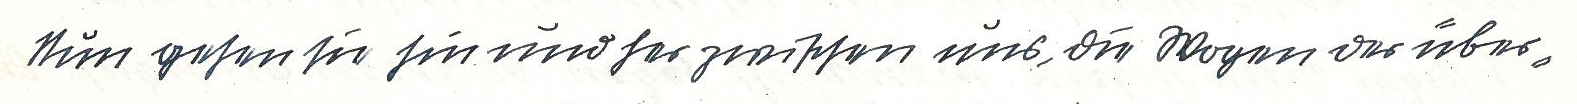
Nun gehen sie hin und her zwischen uns, die Boten der über¬
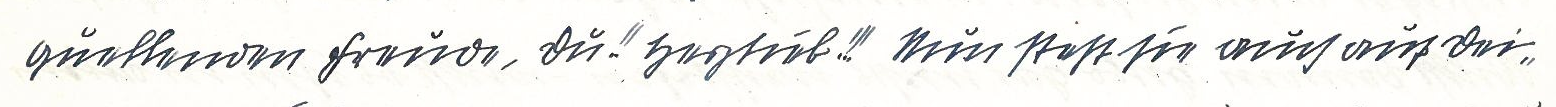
quellenden Freude, Du!! Herzlieb!!! Nun steht sie auch auf Dei¬
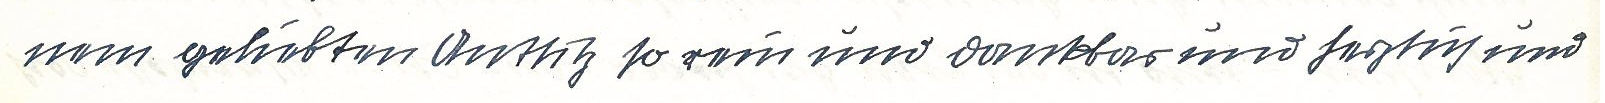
nem geliebten Antlitz so rein und dankbar und herzlich und
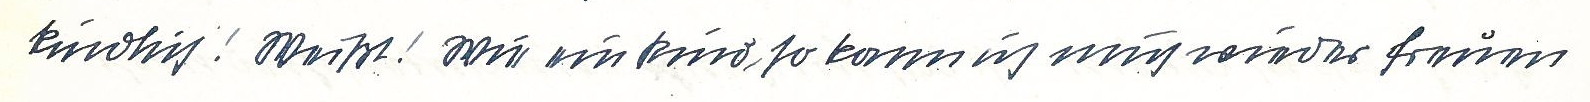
kindlich! Weißt! Wie ein Kind, so kann ich mich wieder freuen
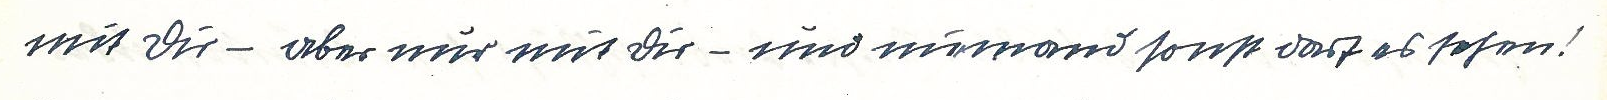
mit Dir – aber nur mit Dir – und niemand sonst darf es sehen!
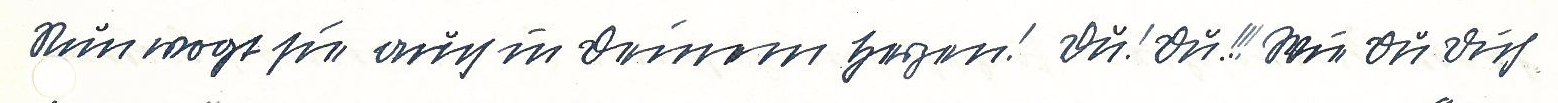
Nun wogt es auch in Deinem Herzen! Du! Du!!! Wie Du Dich
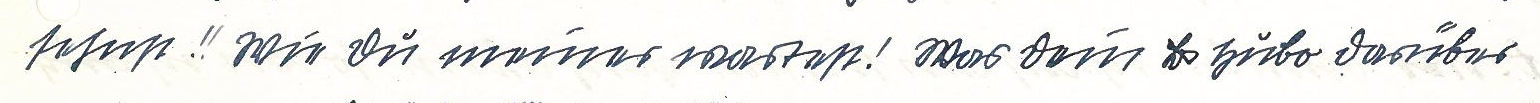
sehnst!! Wie Du meiner wartest! Was Dein B Hubo darüber
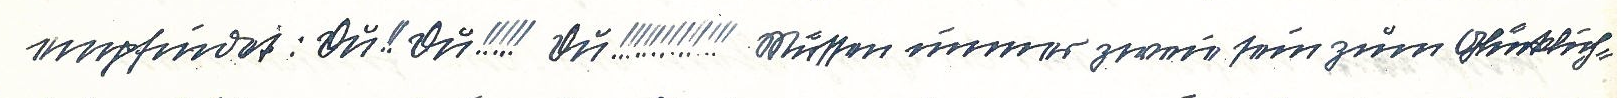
empfindet: Du!! Du!!!! Du!!!!!!!!!!!!! Müssen immer zwei sein zum Glücklich¬
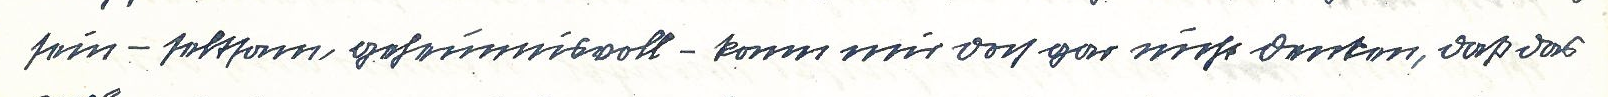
sein – seltsam, geheimnisvoll – kann mir doch gar nicht denken, daß das
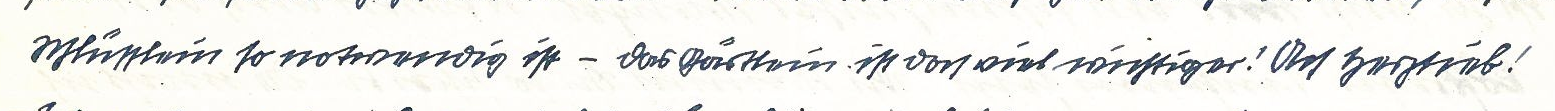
Schlüsslein so notwendig ist – das Gärtlein ist doch viel wichtiger! Ach Herzlieb!
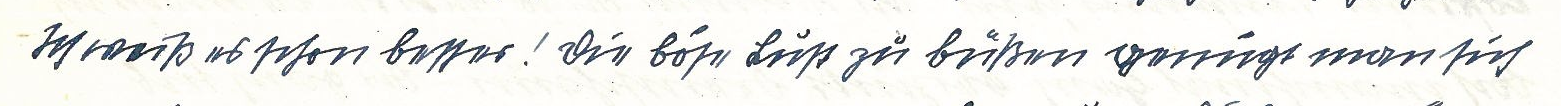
Ich weiß es schon besser! Die böse Lust zu büßen genügt man sich
